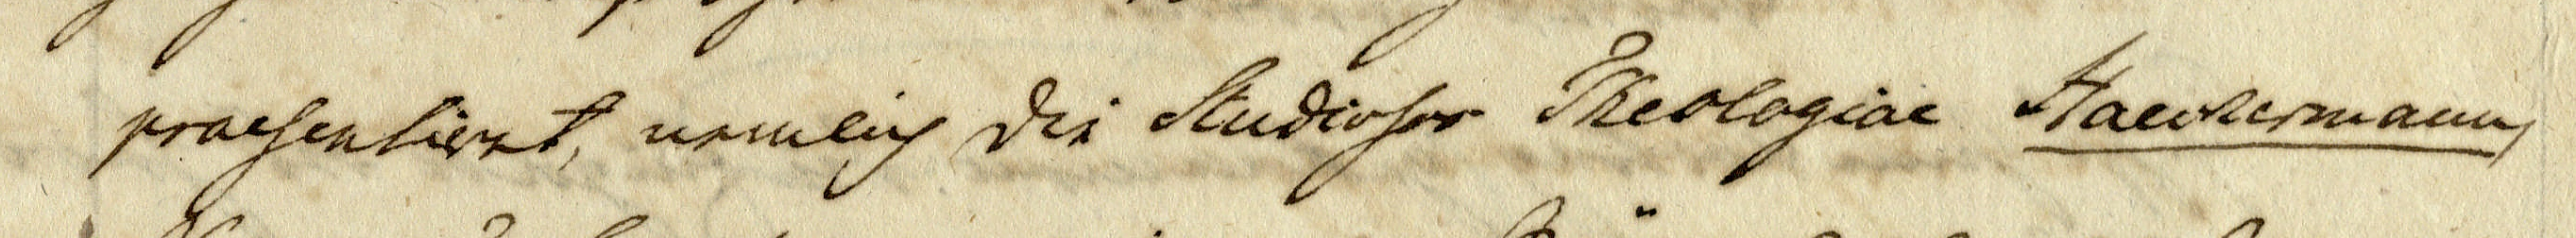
praesentiret, nemlich die Studiosos Theologiae Haeckermann,
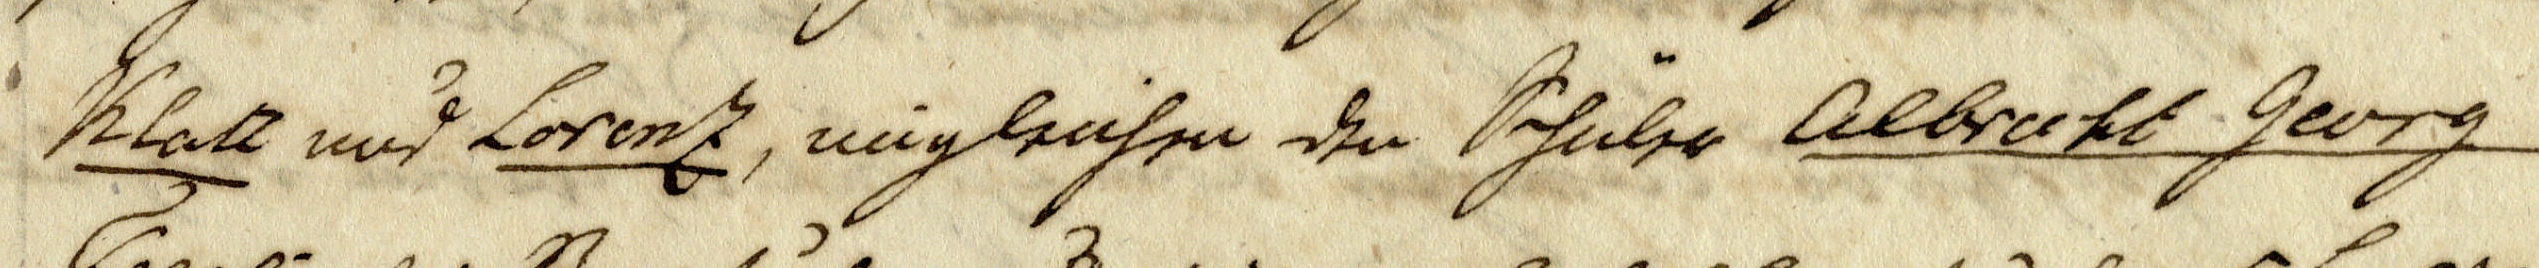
Klatt und Lorenz, imgleichen den Schüler Albrecht Georg
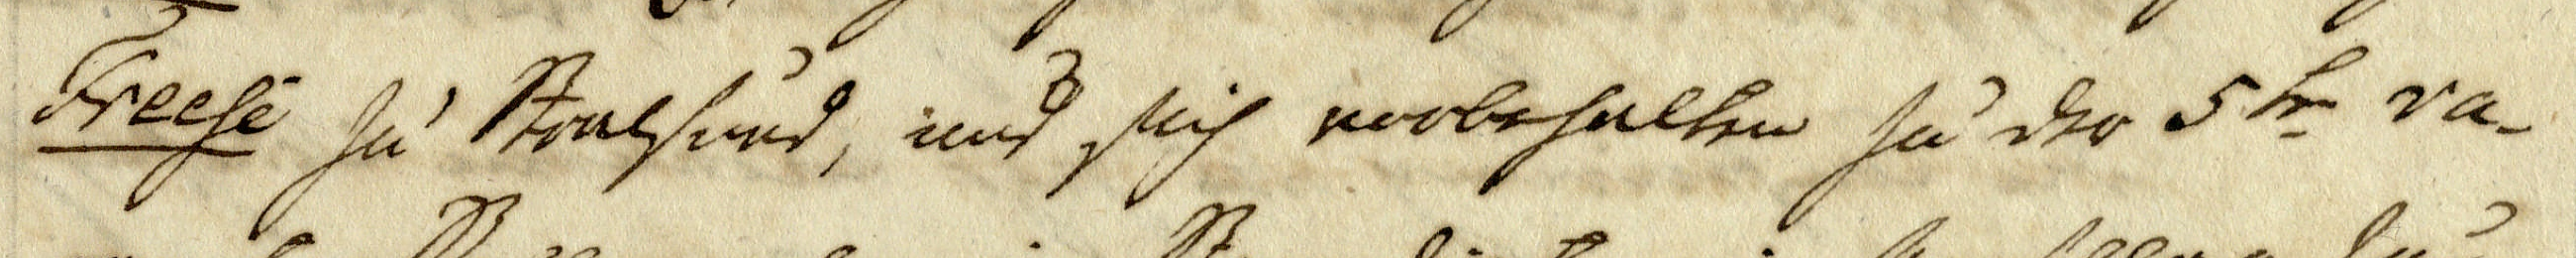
Freese zu Stralsund, und sich vorbehalten zu der 5 ten va¬
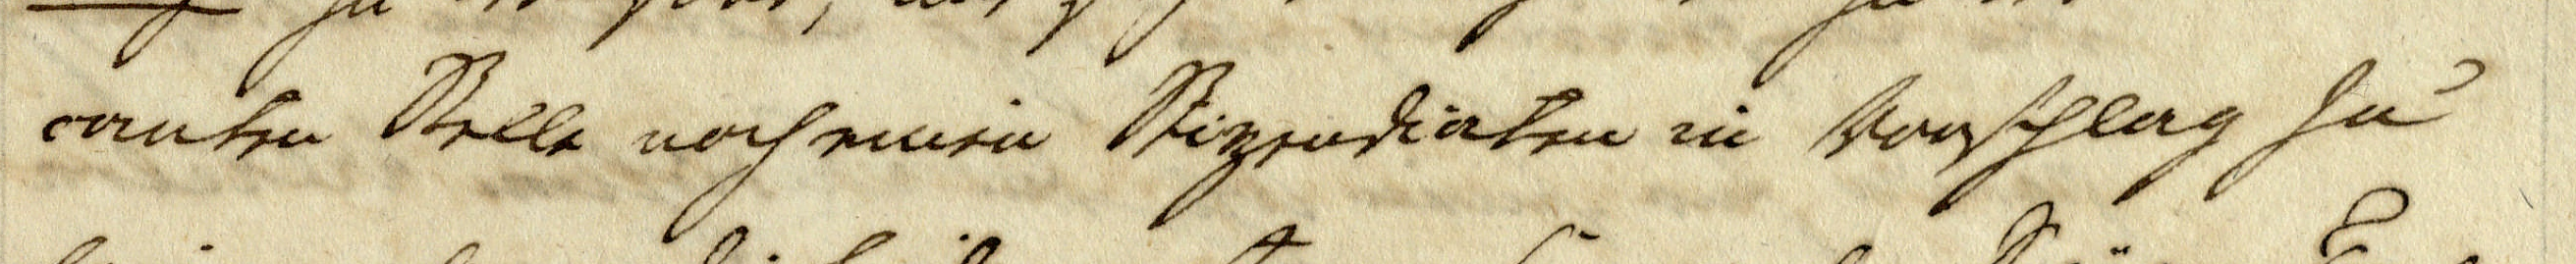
canten Stelle noch einen Stipendiaten in Vorschlag zu
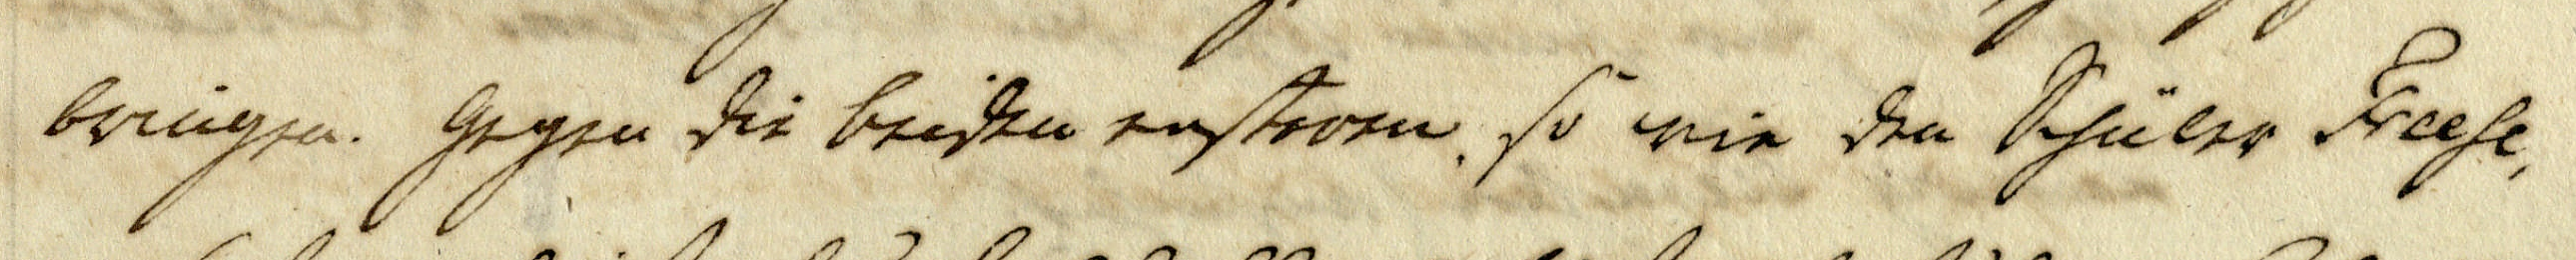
bringen. Gegen die beiden ersteren, so wie den Schüler Freese,
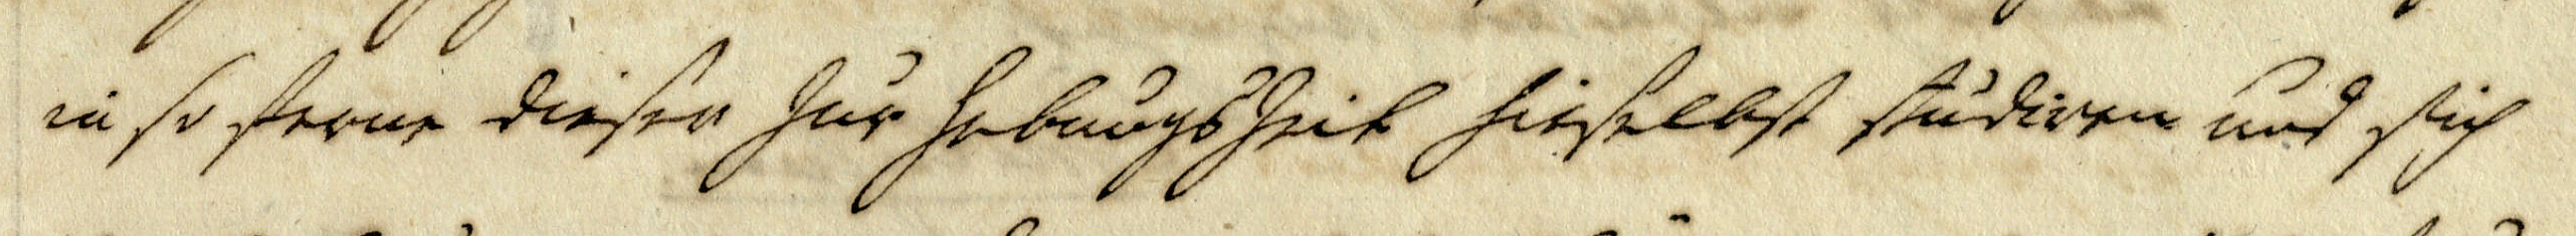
in so ferne dieser zur Hebungszeit hieselbst studiren und sich
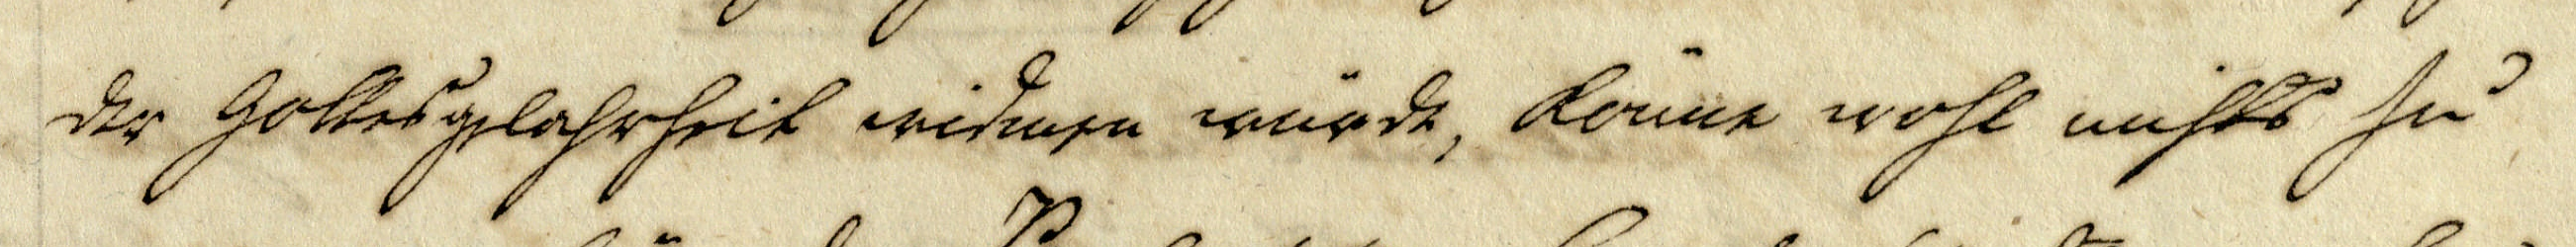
der Gottesgelahrheit widmen würde, könne wohl nichts zu
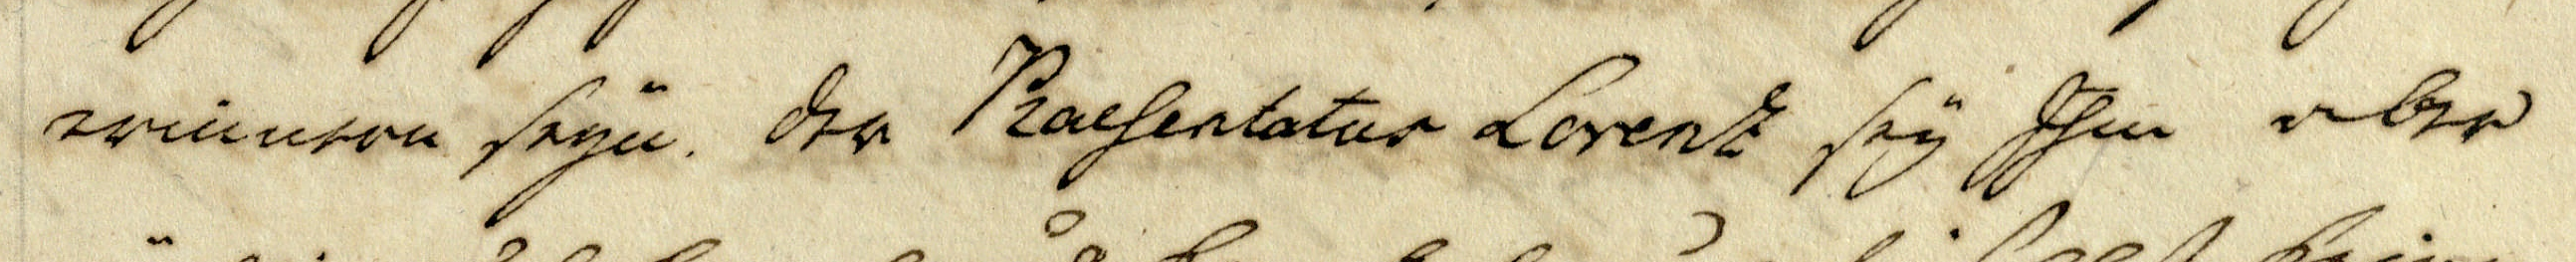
erinnern seÿn. der Praesentatus Lorenz seÿ Ihm aber
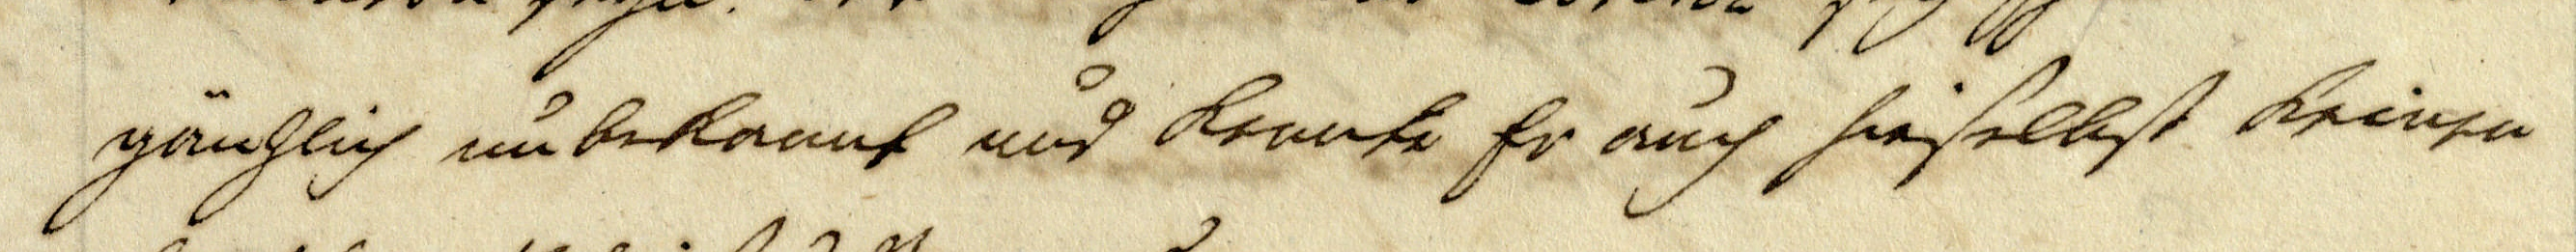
gänzlich unbekannt und kennte Er auch hieselbst keinen
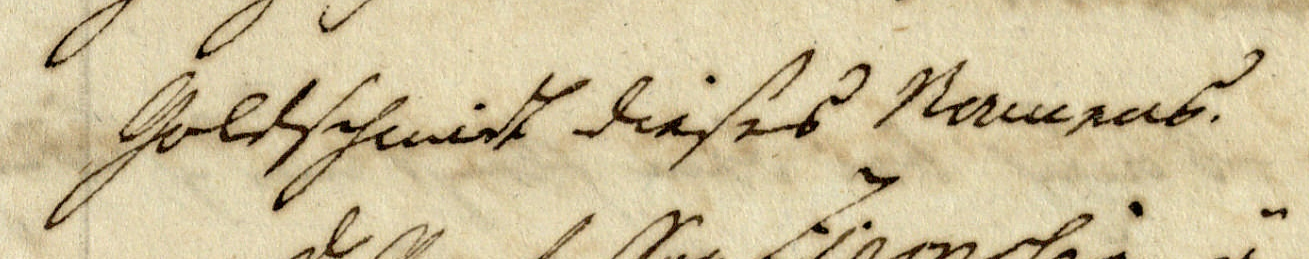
Goldschmidt dieses Namens.
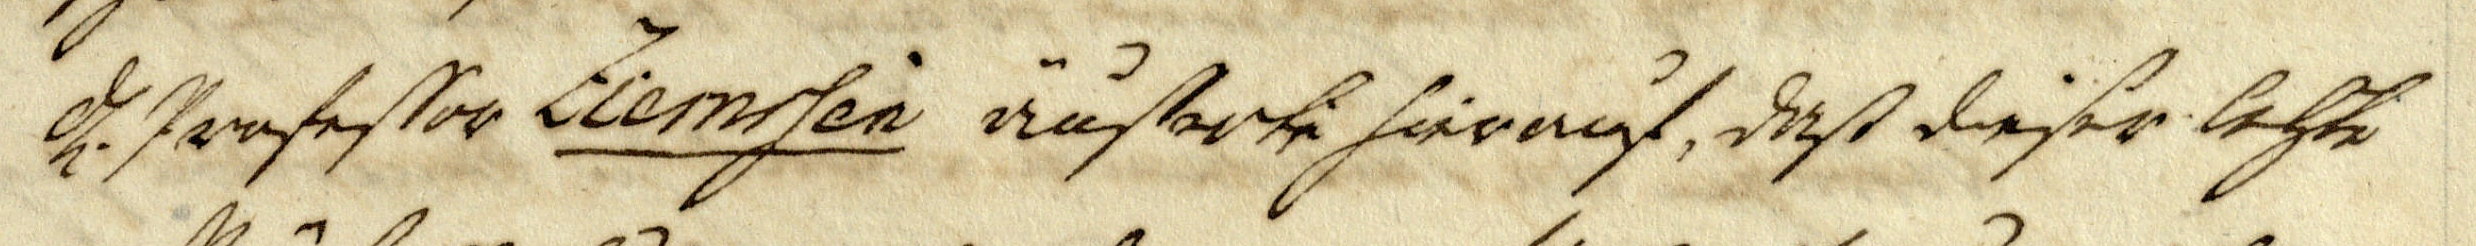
dh. Professor Ziemssen äusserte hierauf, daß dieser letzte
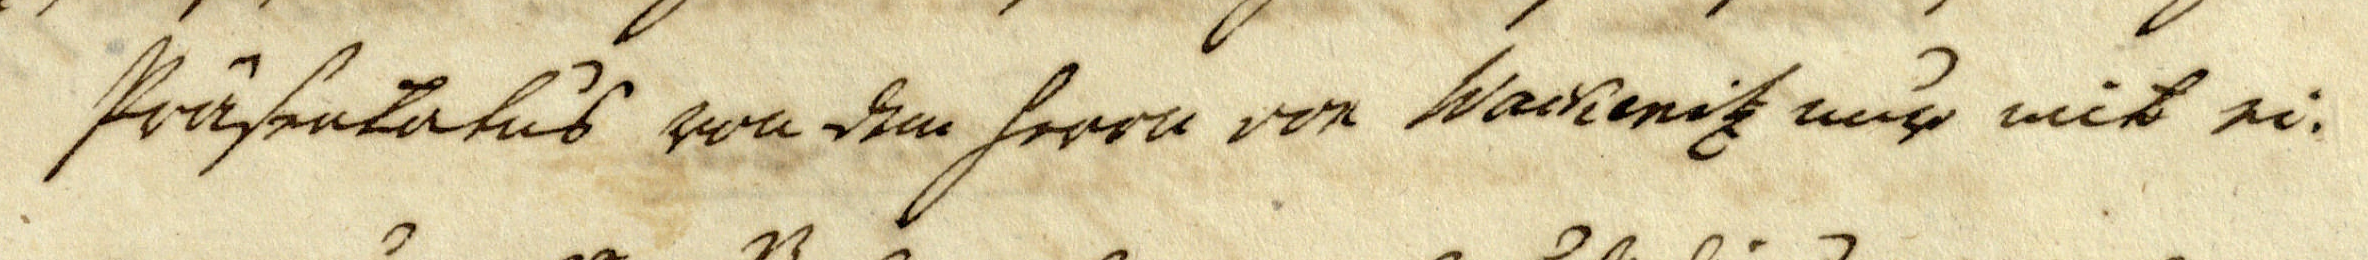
Präsentatus von dem Herrn von Wackenitz nur mit ei¬
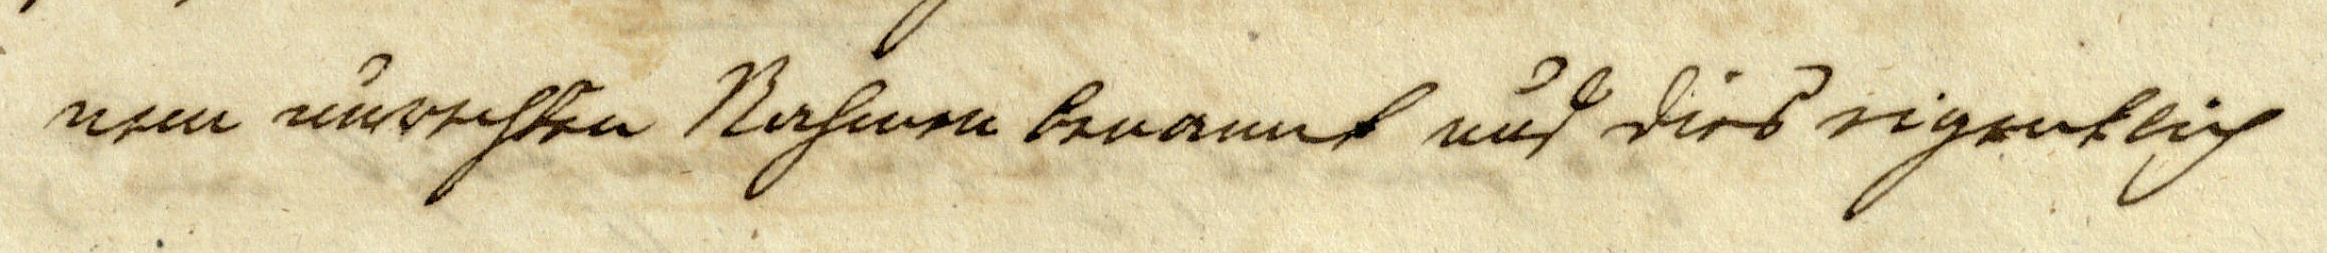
nem unrechten Nahmen benannt und dies eigentlich
